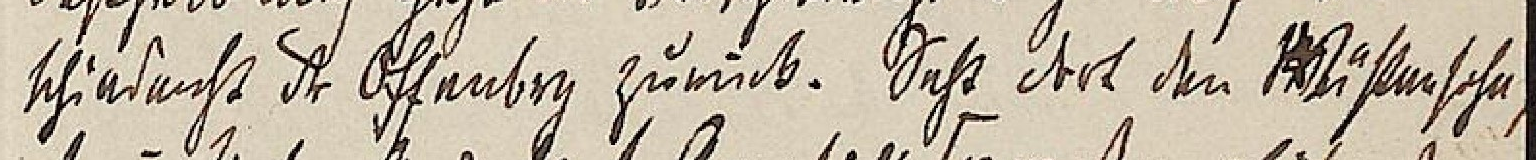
schiedenht dr Offenbrg zurück. Seht dort den Wüstensohn,
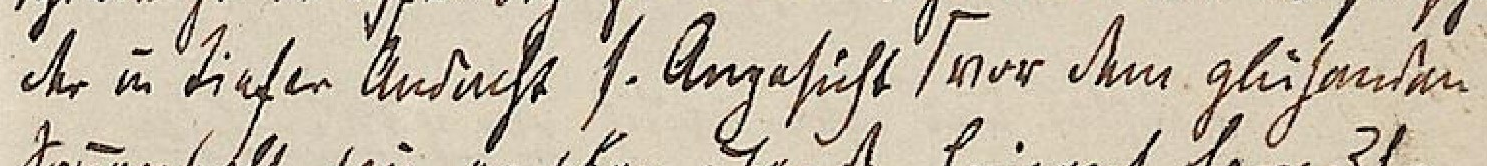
der in tiefer Andacht s. Angesicht [ vor dem glühenden
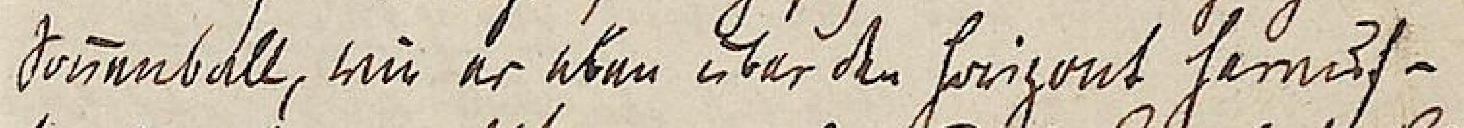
Sonenball, wie er eben über den Horizont herauf¬
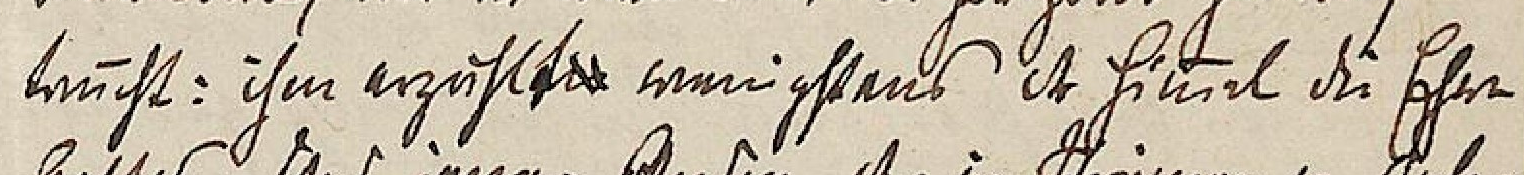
taucht: ihm erzählte wenigstens dr Himel die Ehre
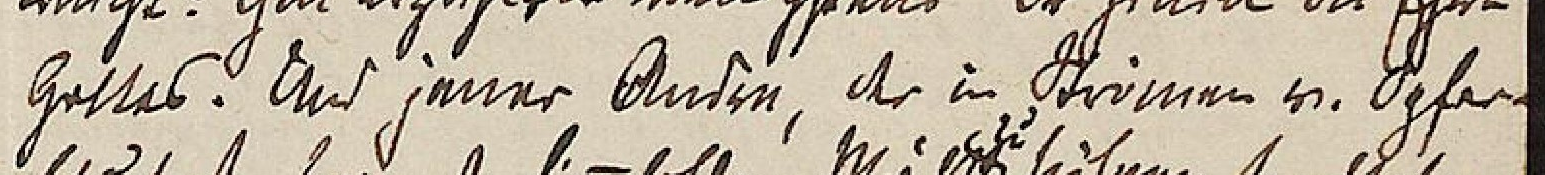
Gottes. Und jener Andre, der in Srömen v. Opfer¬
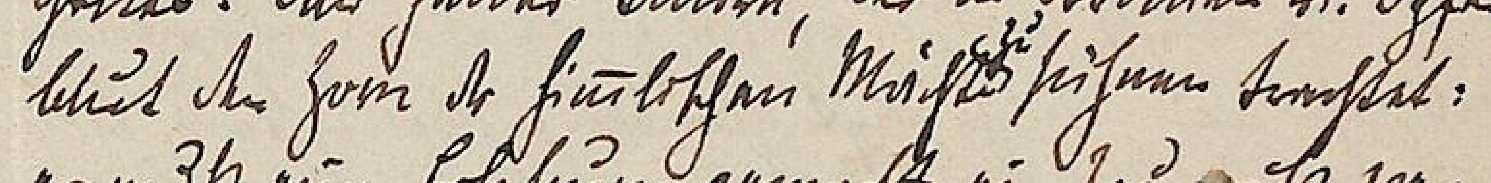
but den Zorn der himlischen Mächte zu sühnen trachtet:
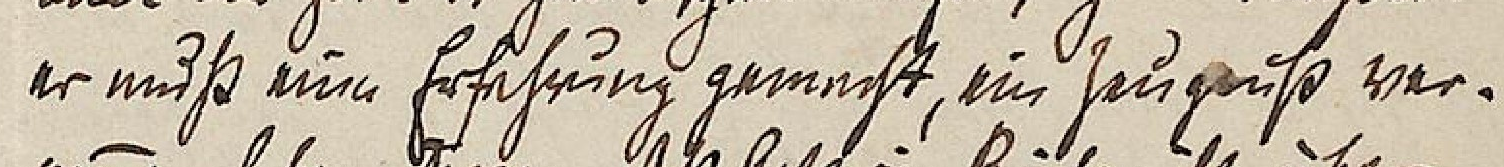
er mußt eine Erfahrung gemacht, ein Zeugniß ver¬
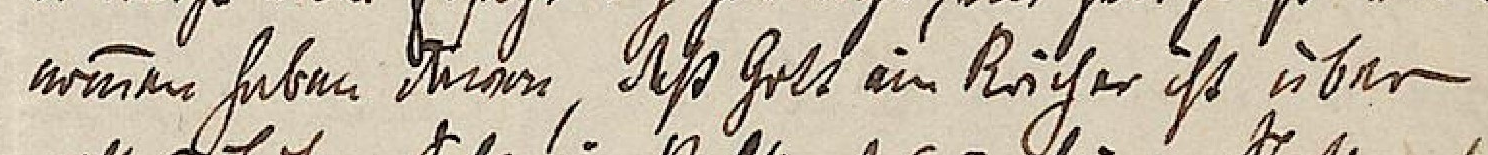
nomen haben davon, das Gott ein Rächer ist über
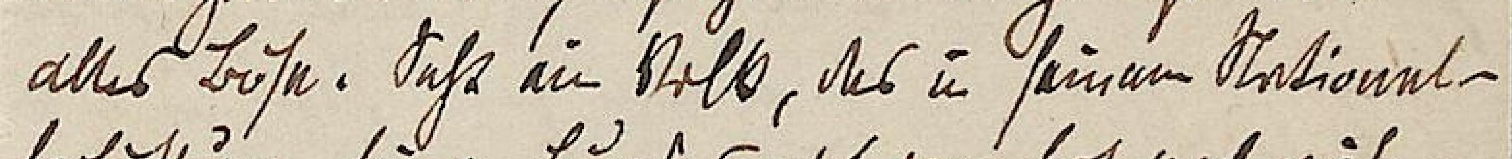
alles Böse. Seht ein Volk, das in seinem National¬
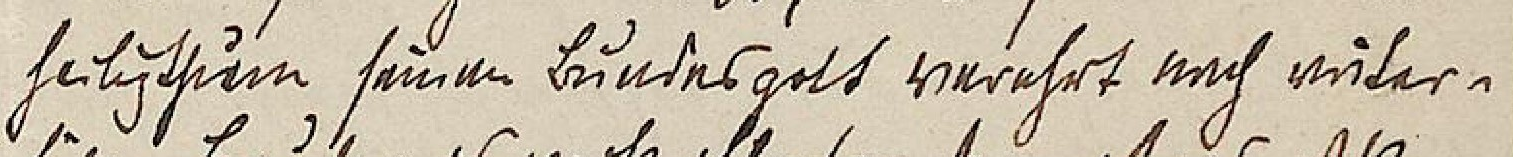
heiligthum seinem Bundesgott verehrt nach väter¬
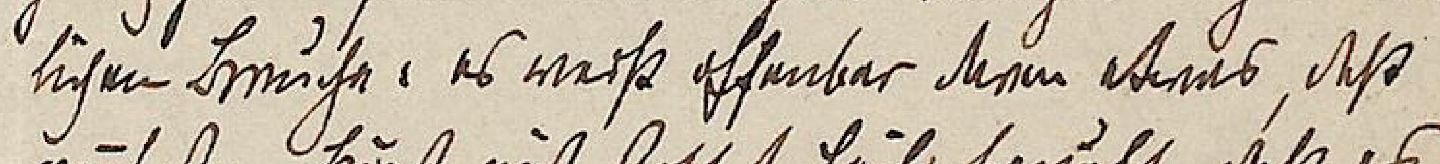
lichem Brauche: es weiß offenbar davon etwas, daß
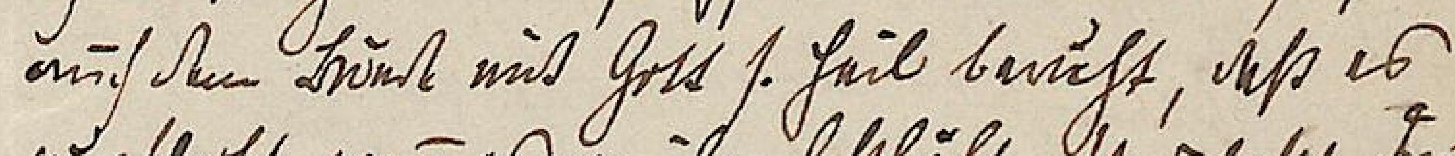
auf dem Bund mit Gott s. Heil beruht, daß es
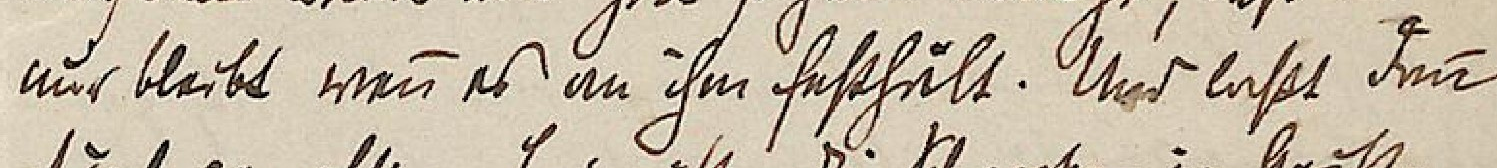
nur bleibt, wen es an ihm festhält. Und laßt dan
